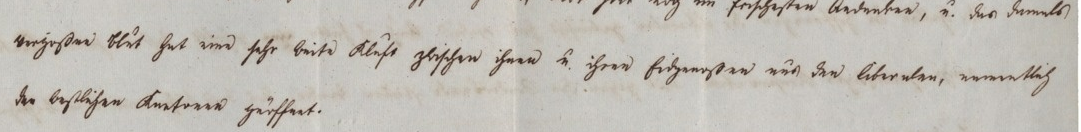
vergoßne Blut hat eine sehr weite Kluft zwischen ihnen u. ihren Eidgenossen aus den liberalen, namentlich
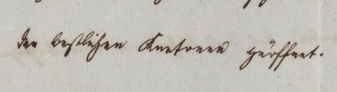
den westlichen Kantonen geöffnet.
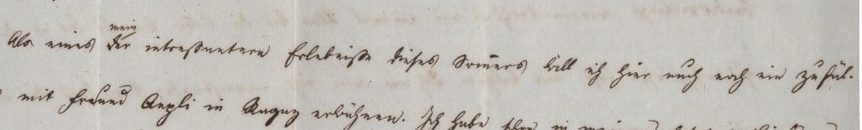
Als eines dmeiner intressantern Erlebnisse dieses Sommers will ich hier auch noch ein zufäl-
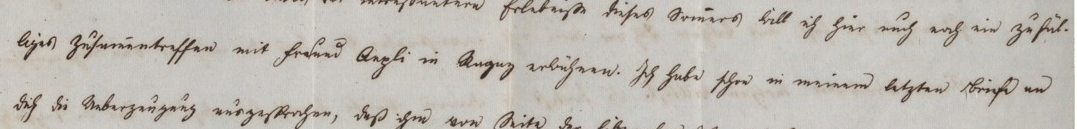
liges Zusammentreffen mit Freund Aepli in Ragaz erwähnen. Ich habe schon in meinem letzten Briefe an
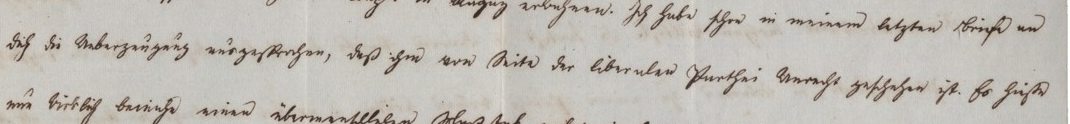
dich die Ueberzeugung ausgesproche, daß ihm von Seite der liberalen Parthei Unrecht geschehen ist. Es hieße
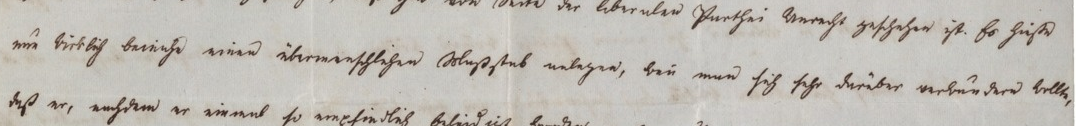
nun wirklich beinahe einen übermenschlichen Maßstab anlegen, wenn man sich sehr darüber verwundern wollte,
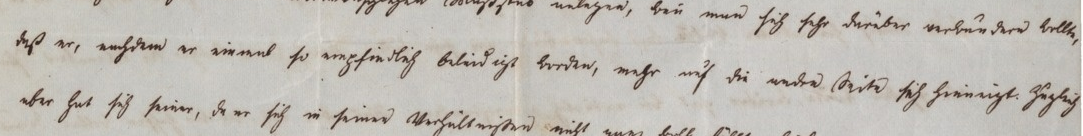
daß er, nachdem er einmal so empfindlich beleidigt worden, mehr auf die andre Seite sich hinneigt. Zugleich
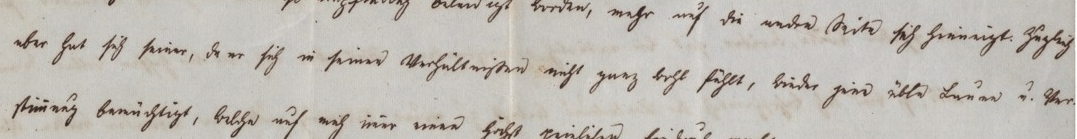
aber hat sich seiner, da er sich in seinen Verhältnissen nicht ganz wohl fühlt, wieder jene üble Laune u. Ver-
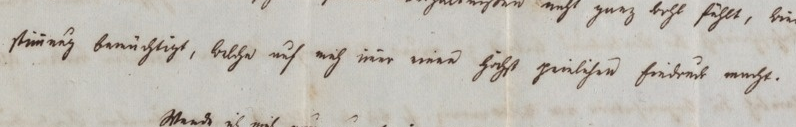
stimmung bemächtigt, welche auf mich immer einen höchst peinlichen Eindruck macht.
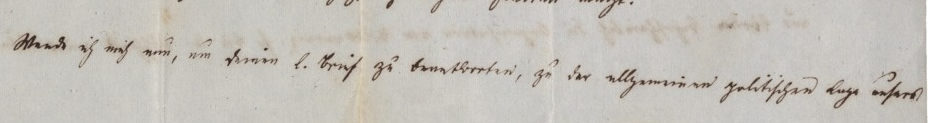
Wende ich mich nun, um deinen l. Brief zu beantworten, zu der allgemeinen politischen Lage unsers
